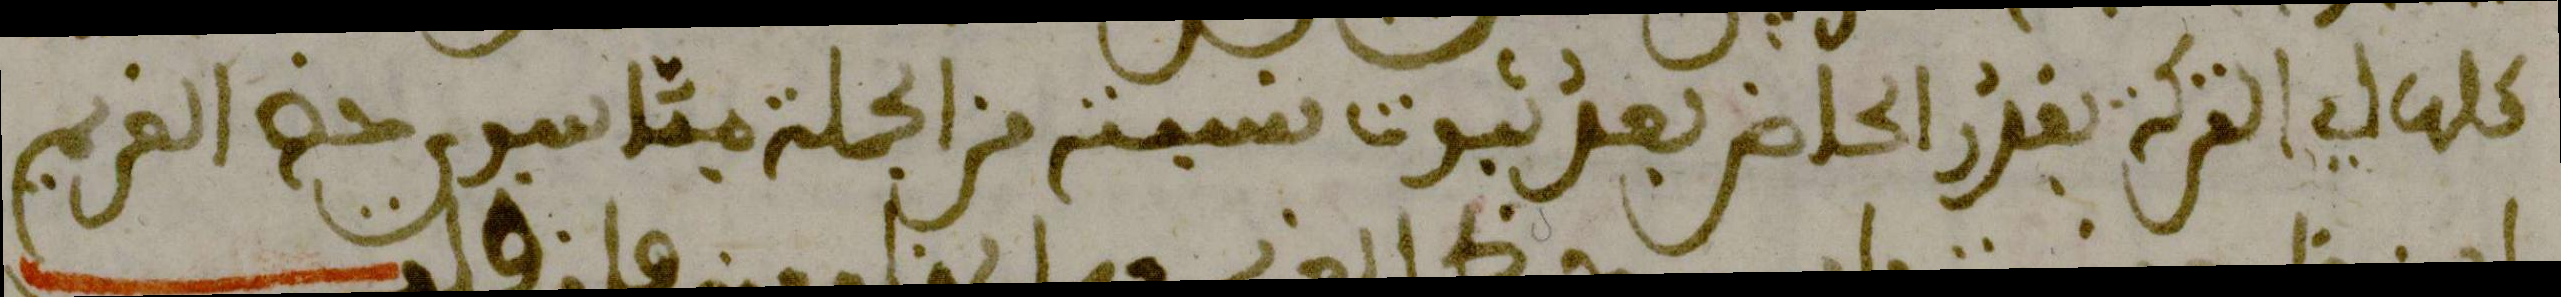كلها اي التركة بقدر الحاضر بعد ثبوت نسبته من الجملة مِمَّا سوى حض الغريم
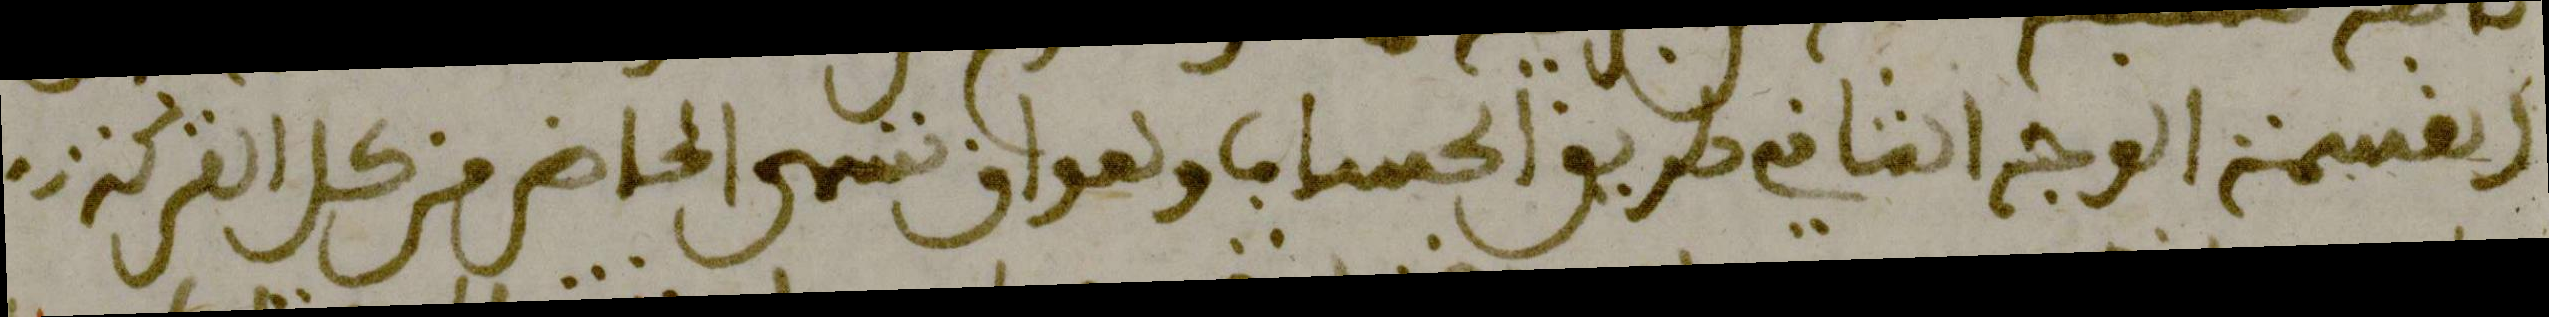القسمة الوجه الثاني طريق الحساب وهو ان تسمى الحاضر من كل التركة
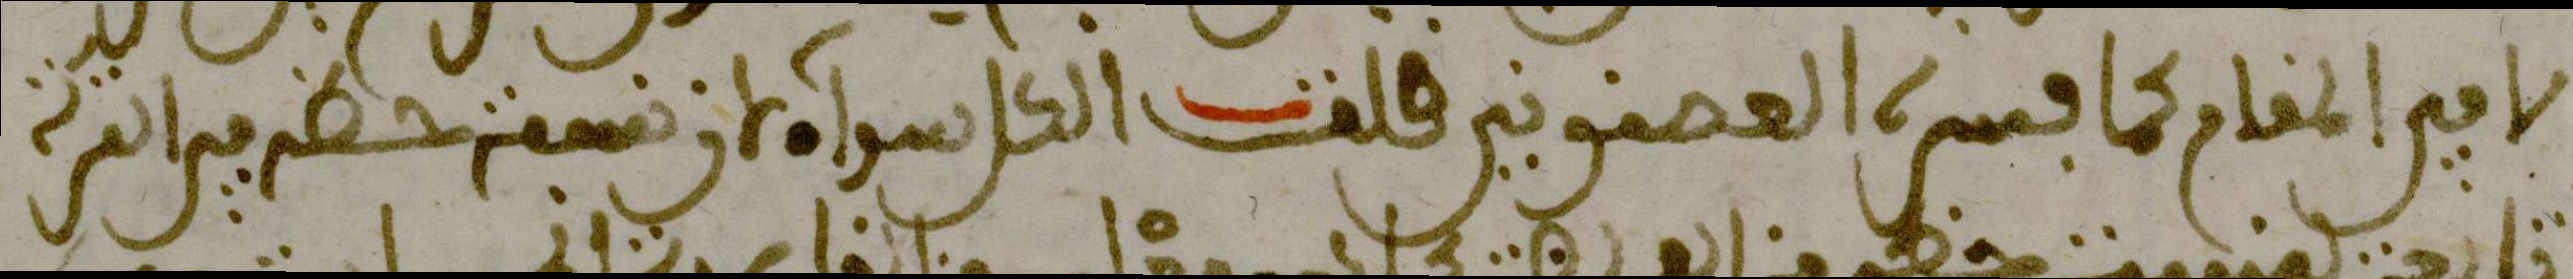لا في المقام كما فسره العصنوني قلتَ الكل سواء لان نسبة حظه في التركة
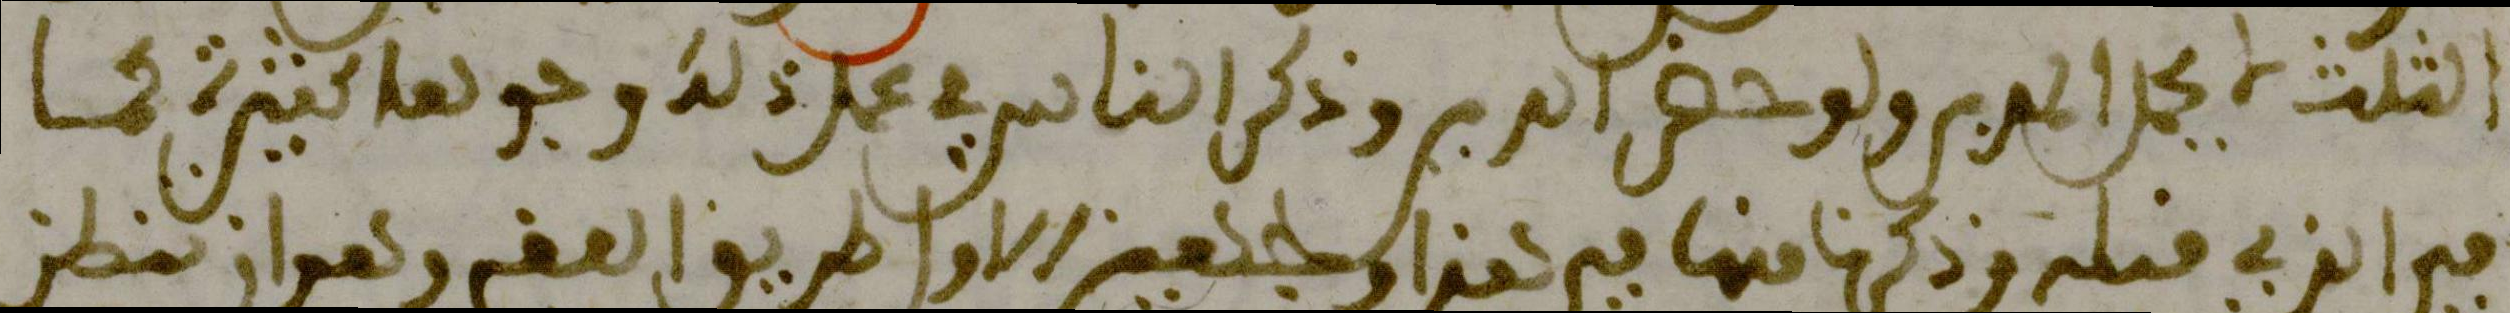الثلث لا يحمل المدبر ولو حضر الدين وذكر الناس في عمل ذلك وجوها كثيرة كما
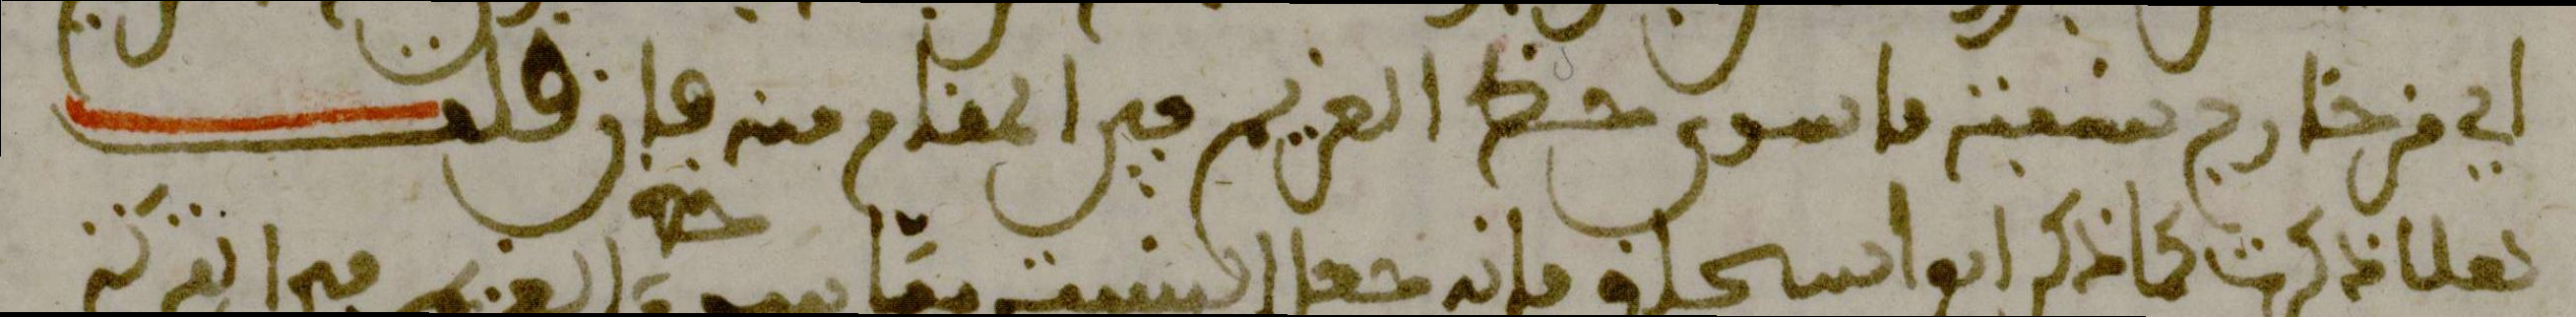اي من خارج نسبة ما سوى حظ الغريم في المقام منه فان قلتَ
